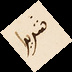شديدا
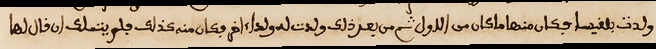ولدت بلقيسا فكان منها ما كان من الاول ثم من بعد ذلك ولدت له ولدا ءاخر فكان منه كذلك فلم يتملك ان قال لها
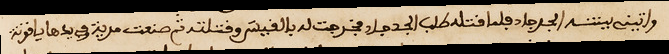واتيني ببنته الجدجاد فلما قتله طلب الجدجاد فخرجت له بالقيس وقتلته ثم صنعت مدية وفي يدها ياقوتة
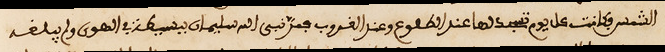الشمس فكانت كل يوم تسجد لها عند الطلوع وعند الغروب فمرّ نبي الله سليمان ببسيطة في الهوى ولم يبلغه
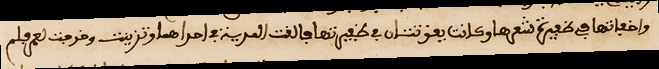واخفاتها في ظفيرة شعرها وكانت يقوتتان في ظفيرتها فالقت المدية في احداهما وتزينت وخرجت لعمر فلم
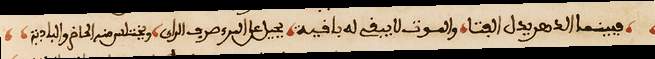فبينما الدهر يدل الفتا والموت لا يبقى له باقية يحير على المرء صرف الراى ويختلس منه الحاضر والبادية
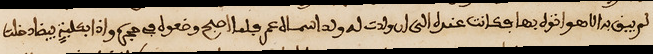لم يبق به الا هو اتوه بها فكانت عنده الى ان ولدت له ولدا سماه عمر فلما اصبح وضعوه في حجره واذا بكلبة بيضا دخلت
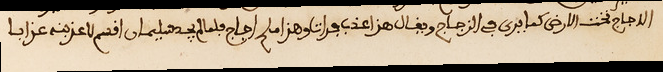الاجاج تحت الارض كما يرى في الزجاج ويقال هذا عذب فرات وهذا ملح اجاج فلما لم يجد سليمان اقسم لاعذبنه عذابا
